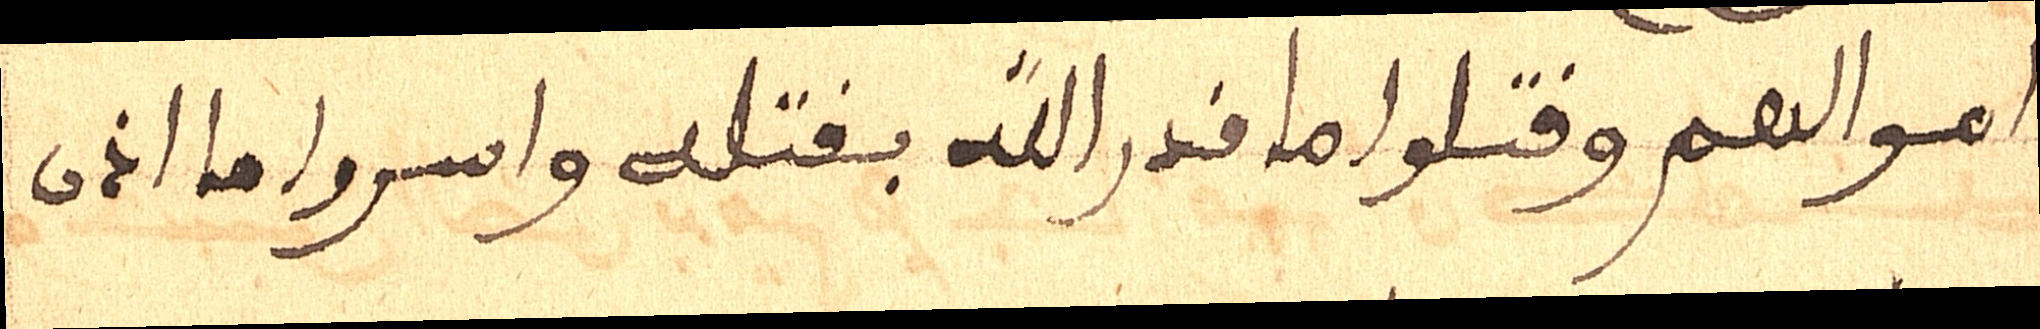اموالهم وقتلوا ما قدر الله بقتله واسروا ما اذن
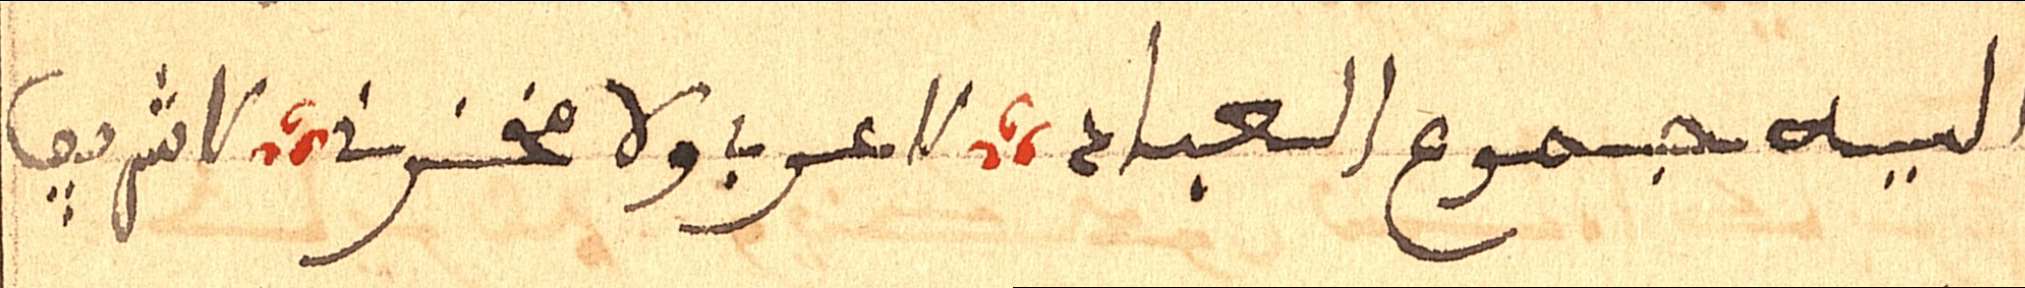اليه جموع العباد لاعربى ولا مخزنى لا شريف
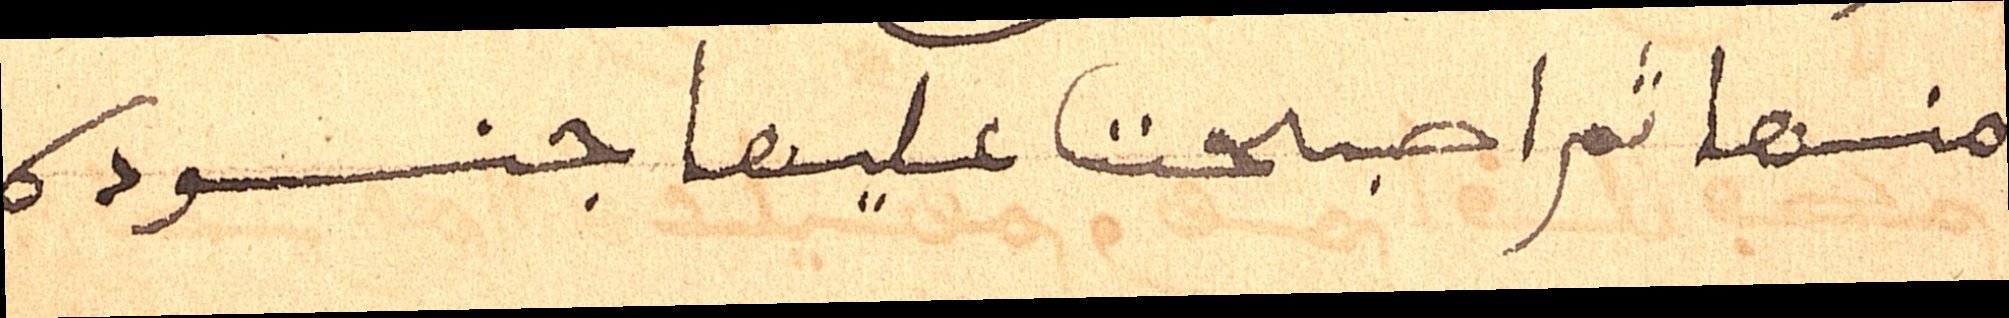منها ثم اصبحت عليها جنوده
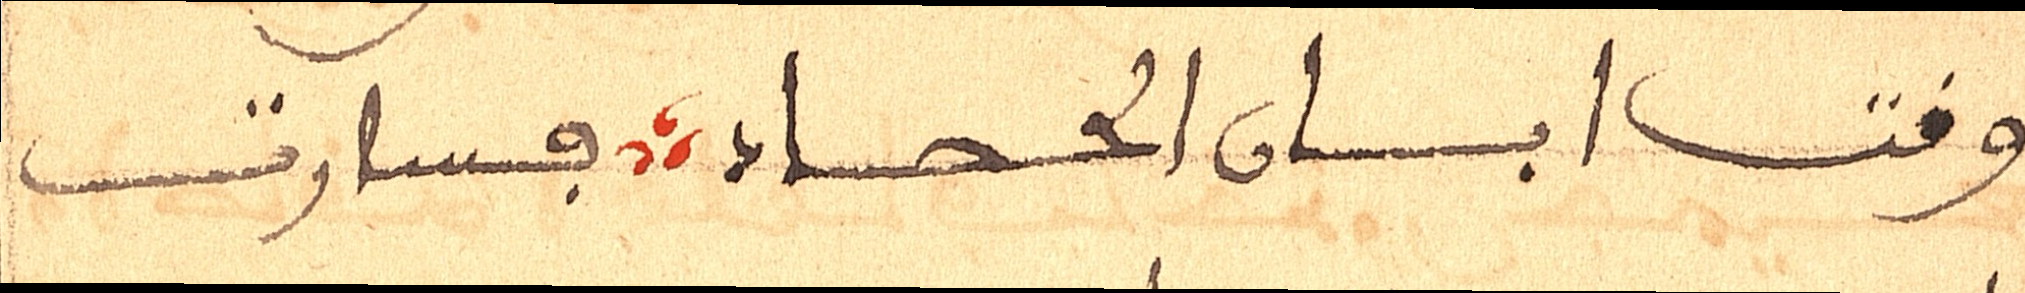وقت ابان الحصاد فسارت
